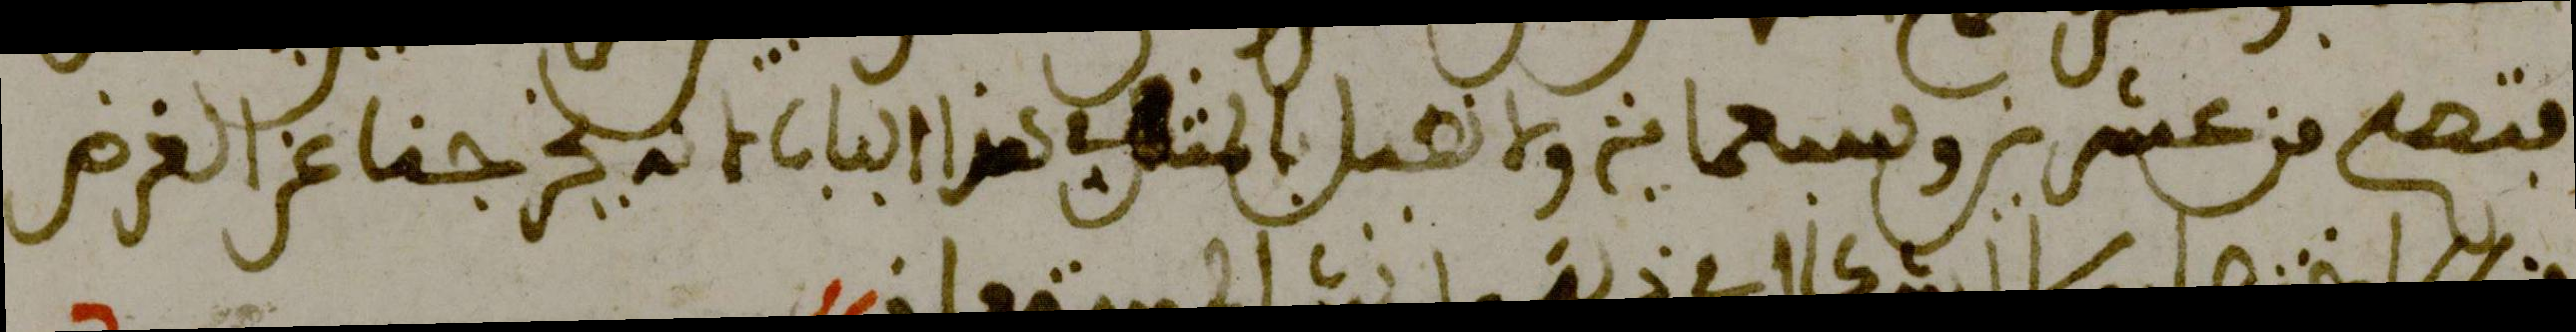فتصح من عشرين وسبعماية ولا نطيل بالمثل في هذا الباب لانه يخرجنا عن الغرض
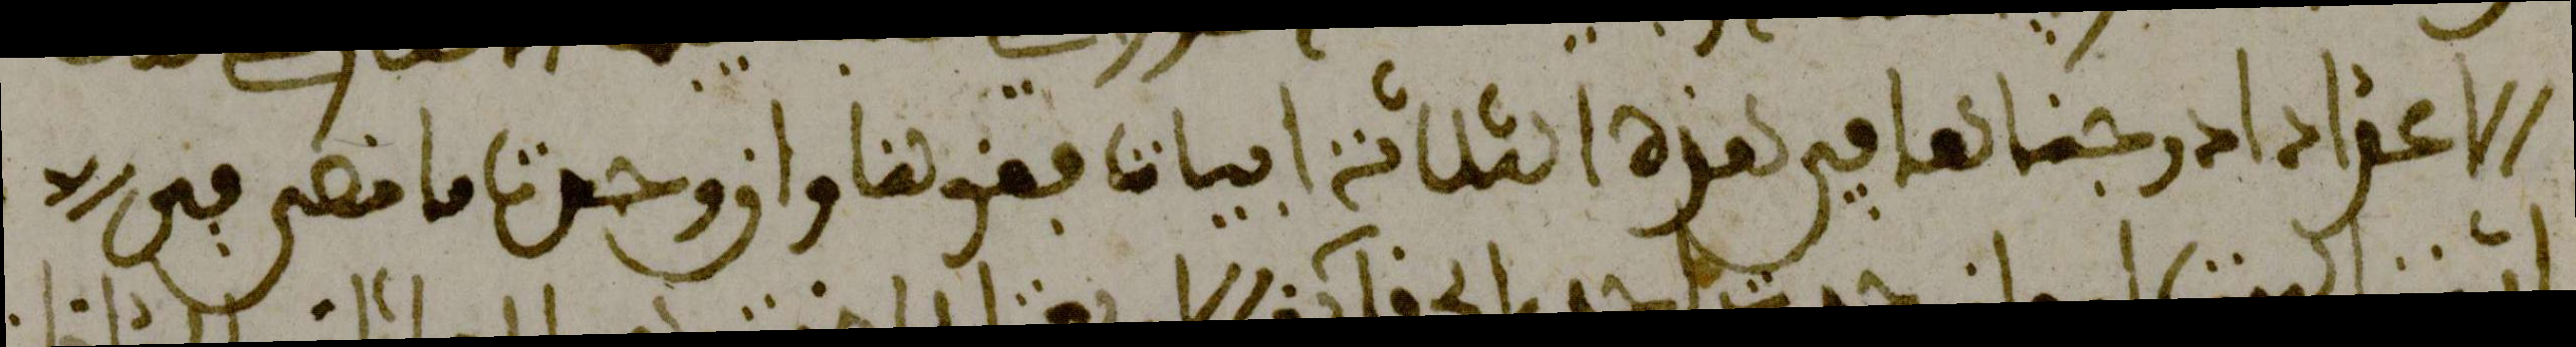الاعداد ادرجناها في هذه الثلاثة ابيات فقولنا وان وجدت ما مضى في
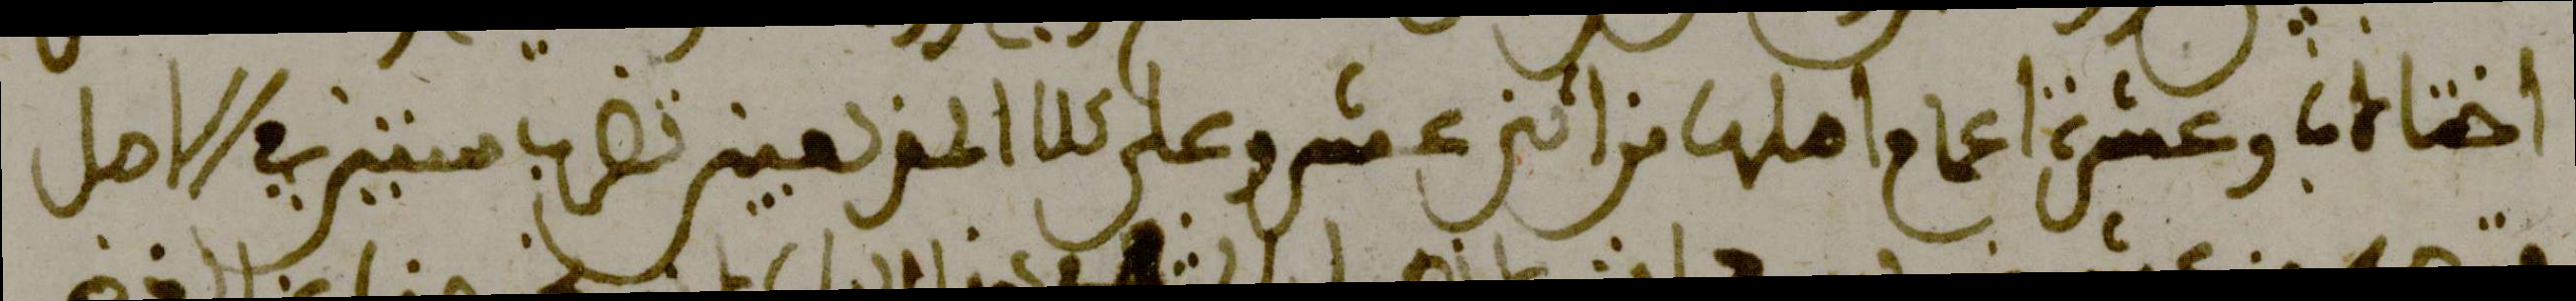اختا لاب وعشرة اعمام اصلها من اثنى عشر وعلى كلا المذهبين تضرب ستين في الاصل
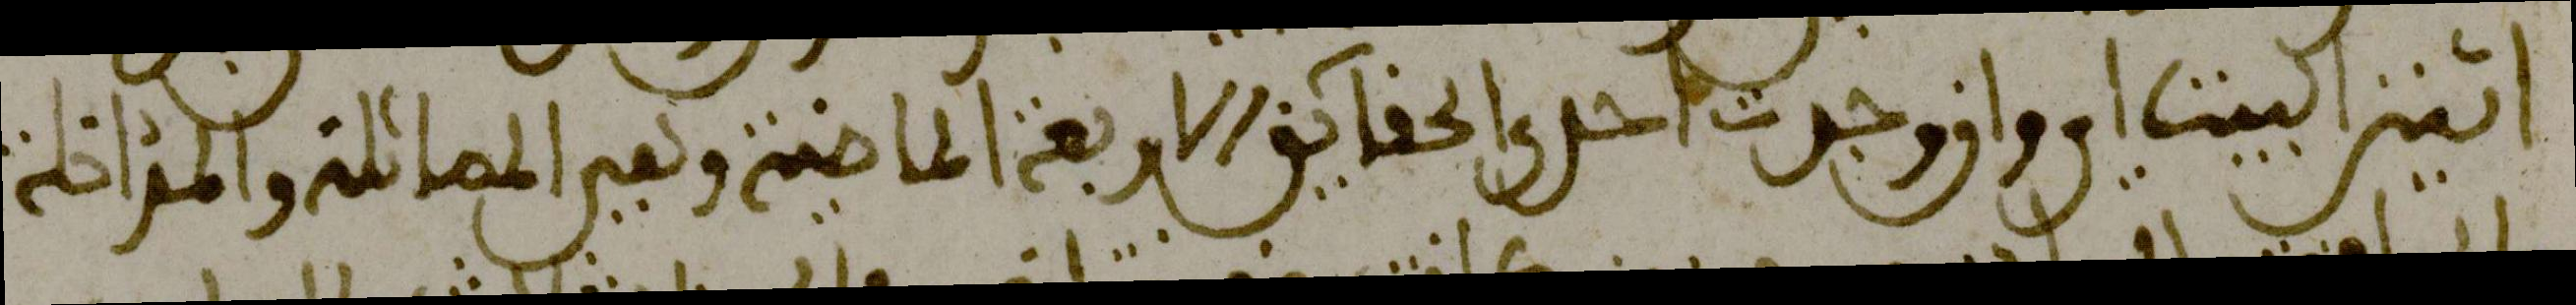اثنين البيت اي وان وجدت احدى الحقائق الاربعة الماضية وهي الماثلة والمداخلة
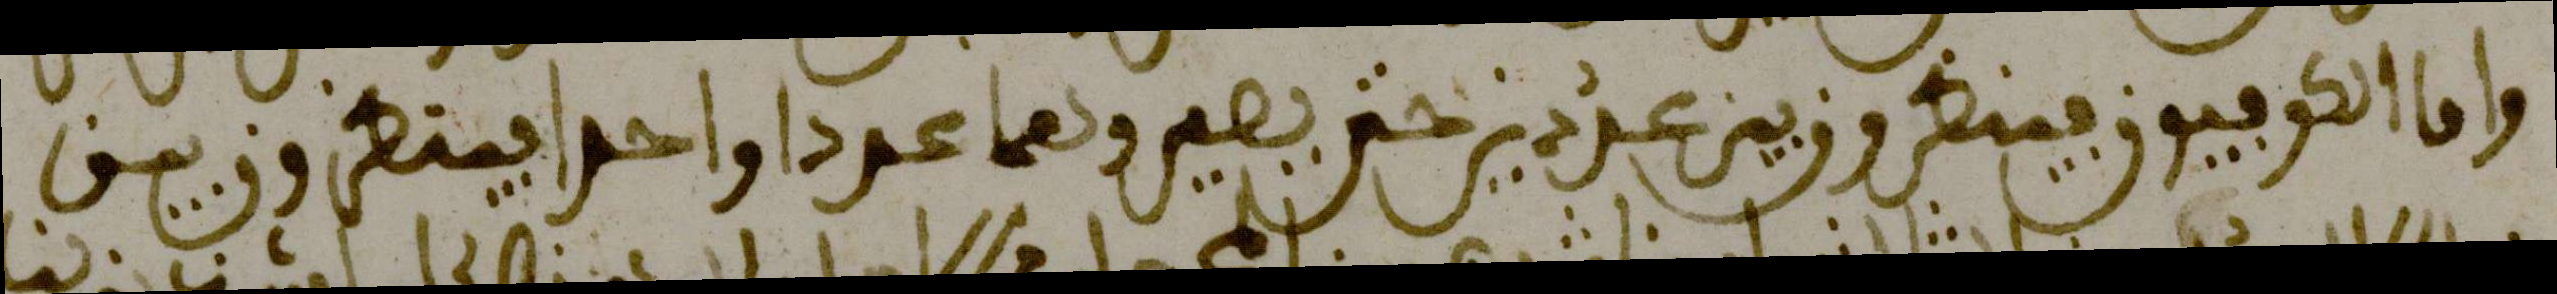واما الكوفيون فينظرون بين عددين حتى يصيروهما عددا واحدا فينظرون بين
